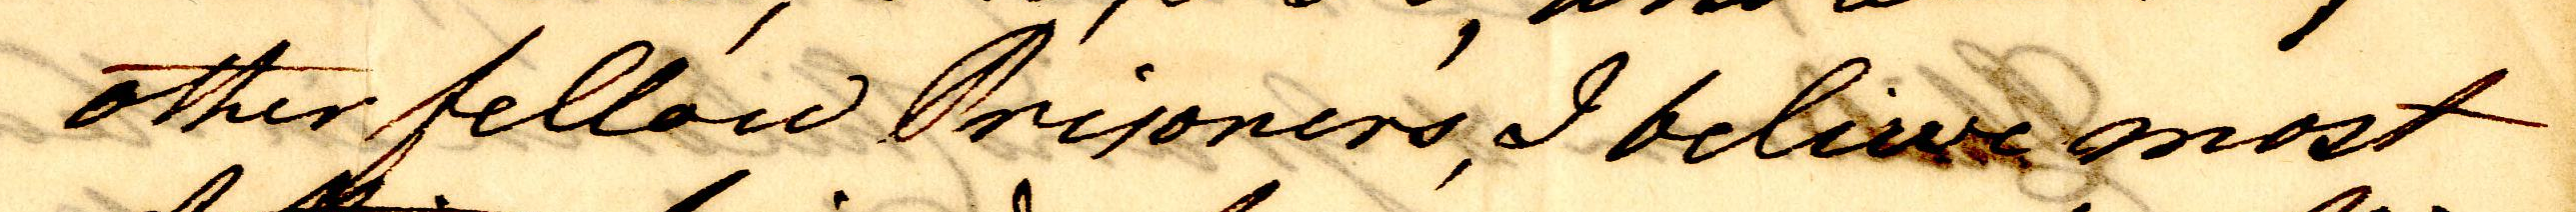other fellow Prisoners, I believe most
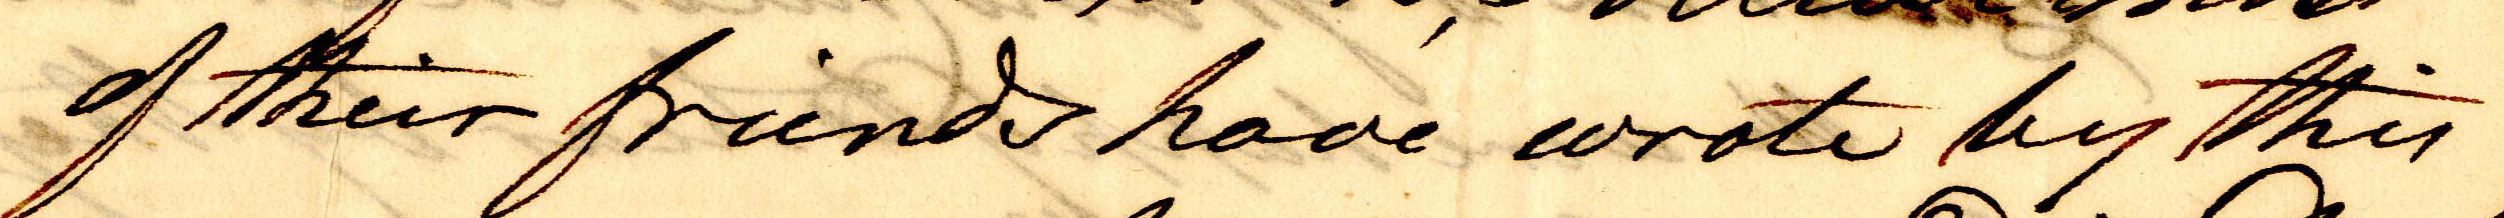of their friends have wrote by this
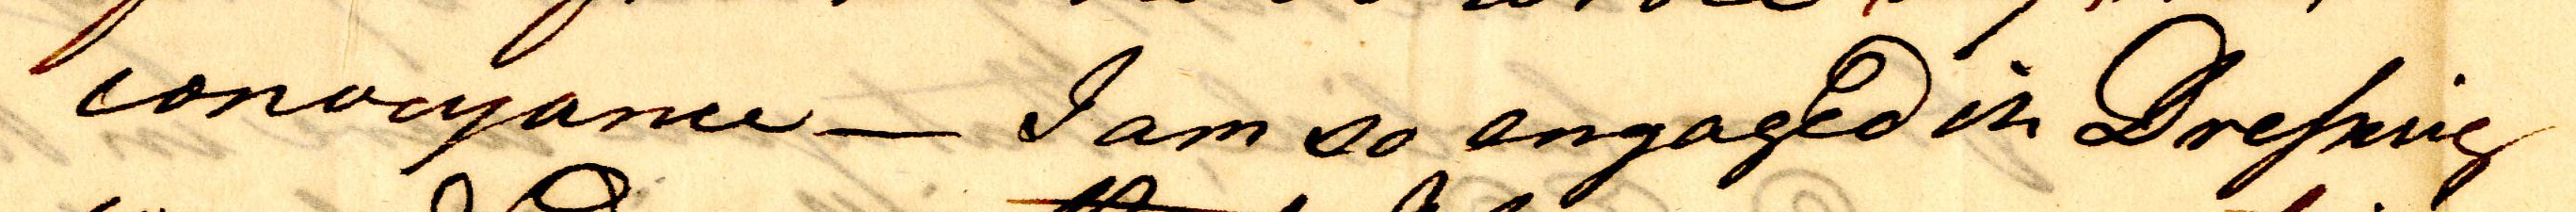conveyance- I am so engaged in Dressing
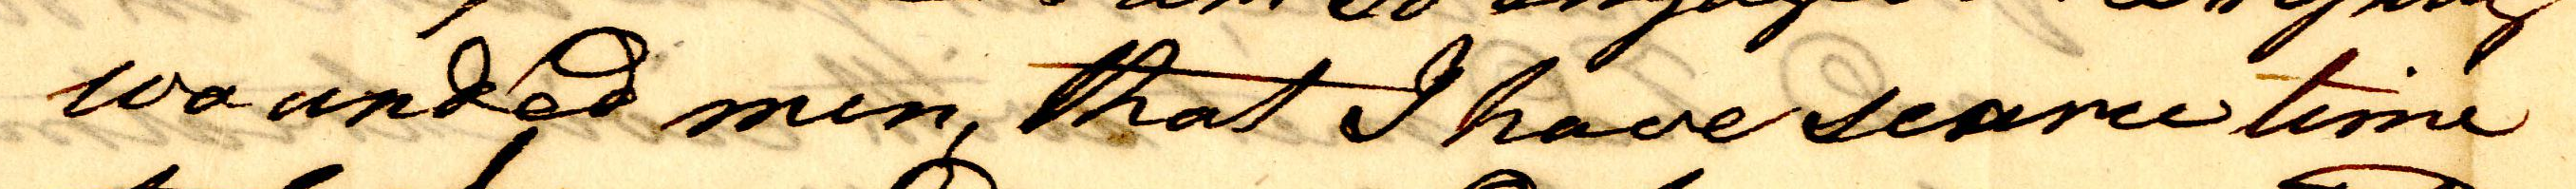wounded men, that I have scarce time
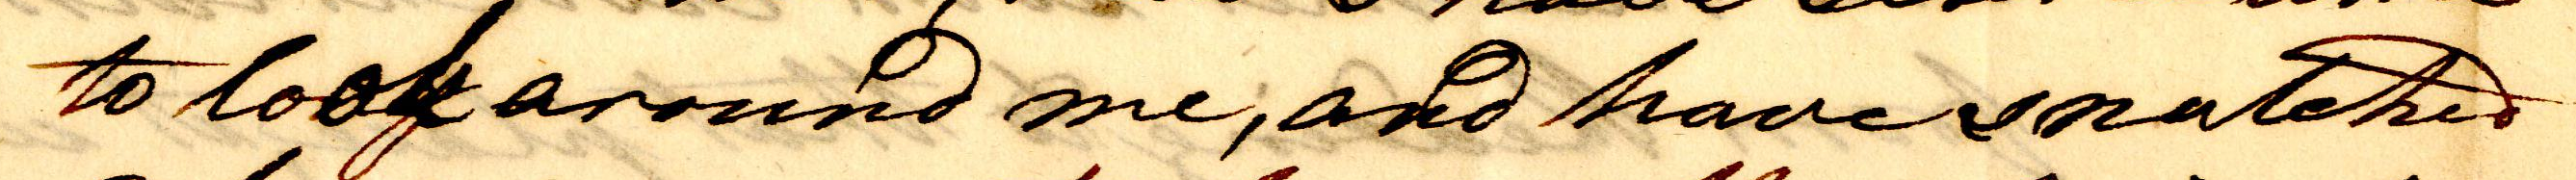to look around me, and have snatched
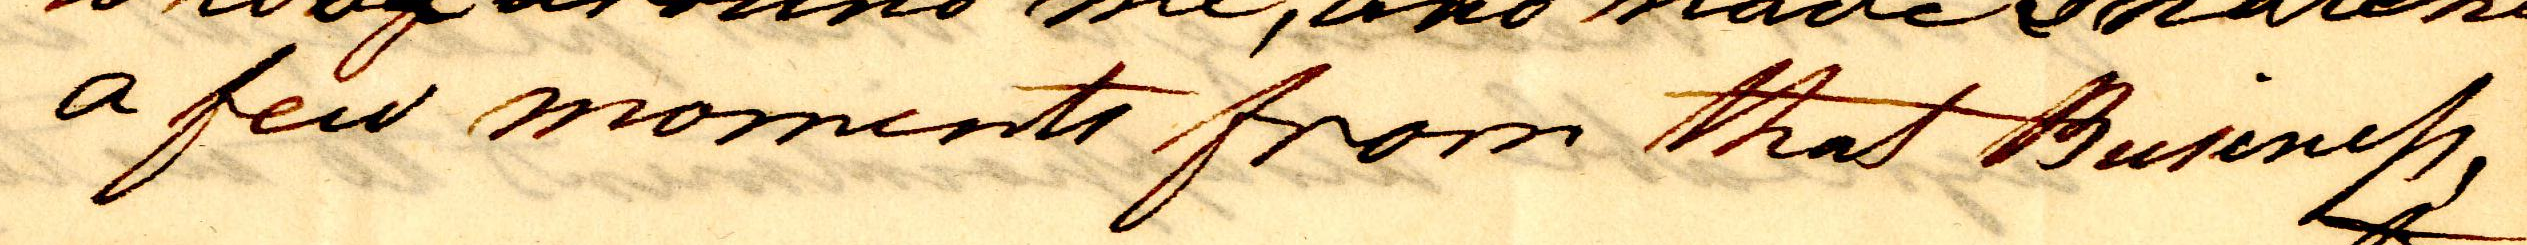a few moments from tat Business,
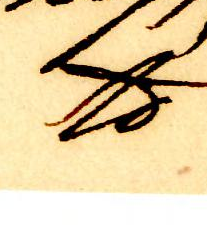to
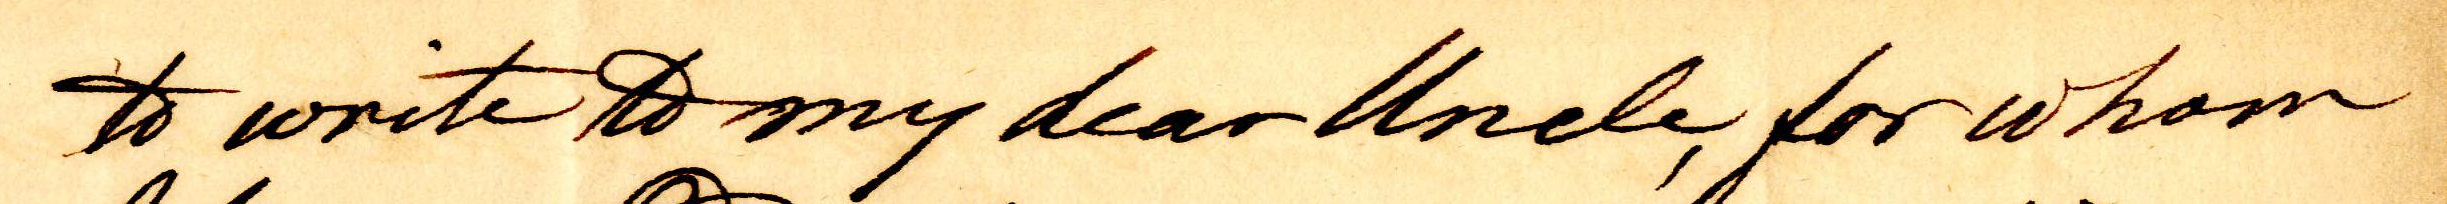to write to my dear Uncle, for whom
